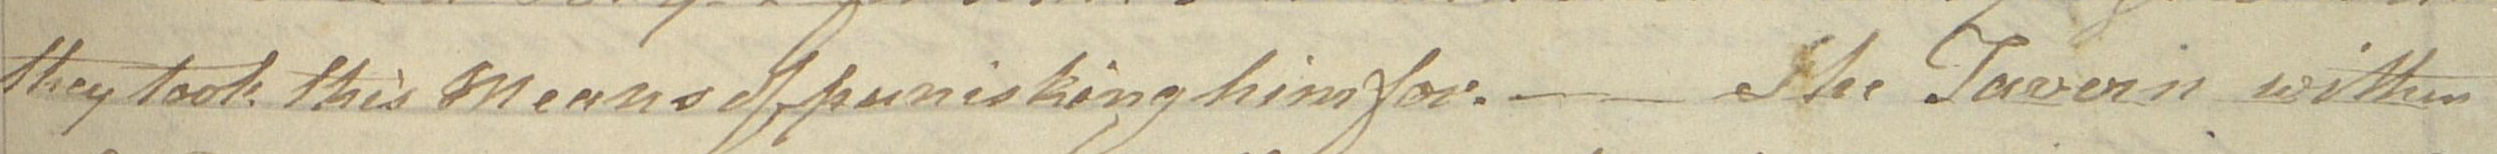they took this Means of punishing him for. The Tavern within
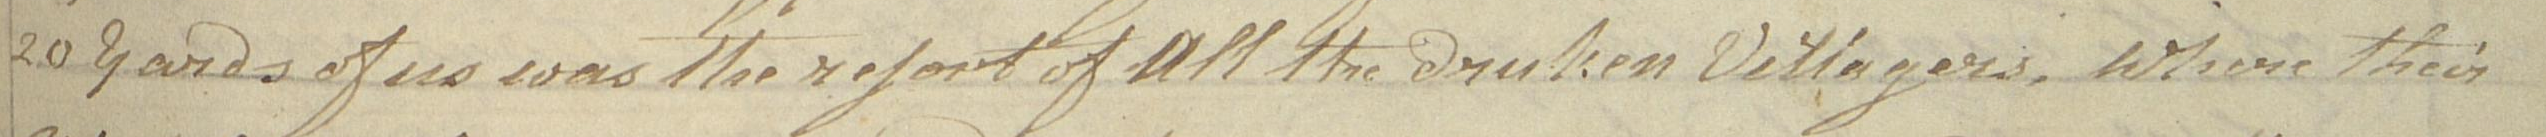20 Yards of us was the resort of All the druken Villagers. Where their
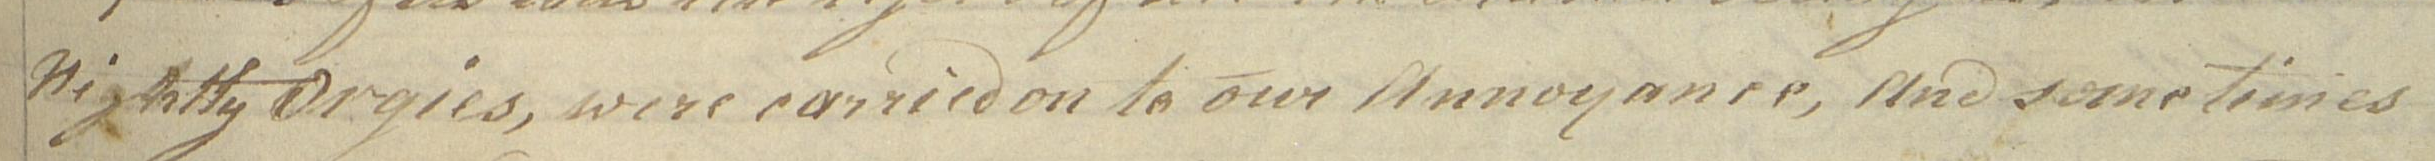Nightly Orgies, were carried on to our Annoyance, and sometimes
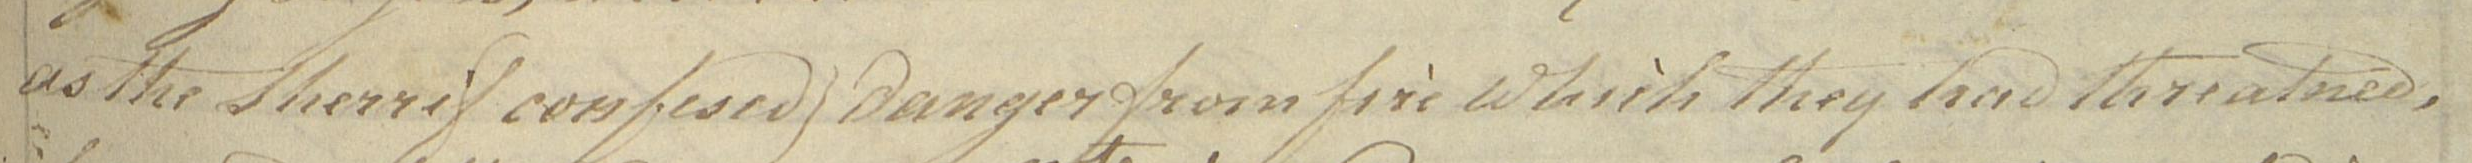as the Sherrif confesed) danger from fire which they had threatned
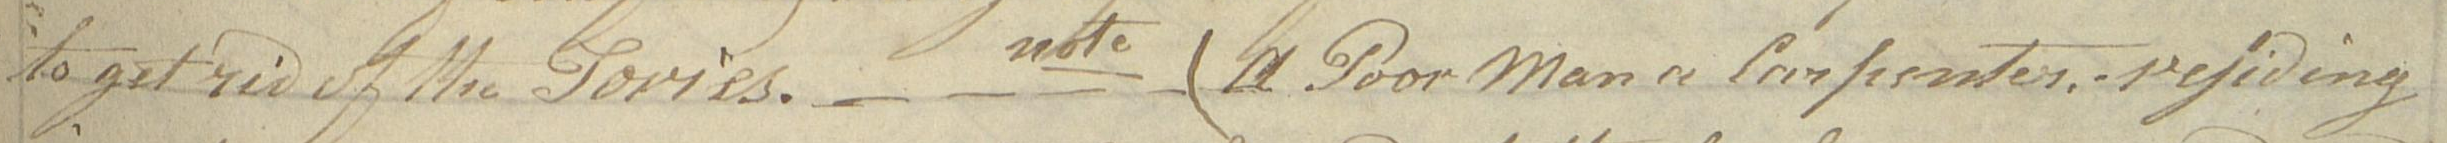to get rid of the Tories. ^ (A Poor Man a Carpenter residing
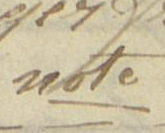note
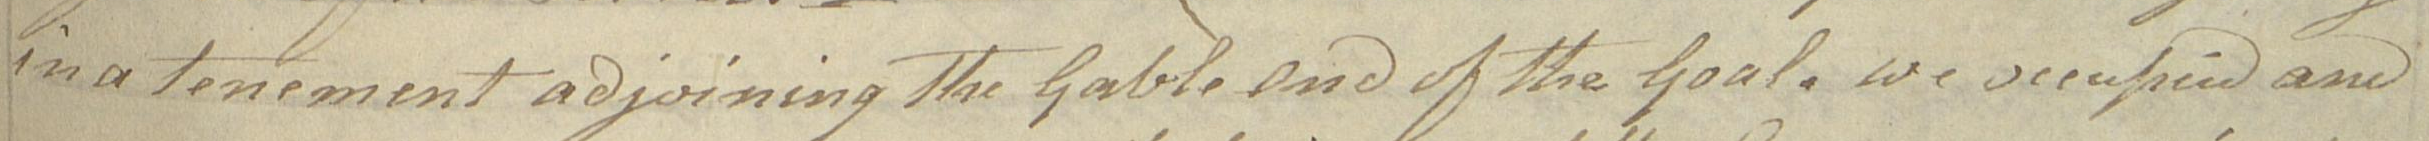in a tenement adjoining the Gable end of the Goal. we occupied and
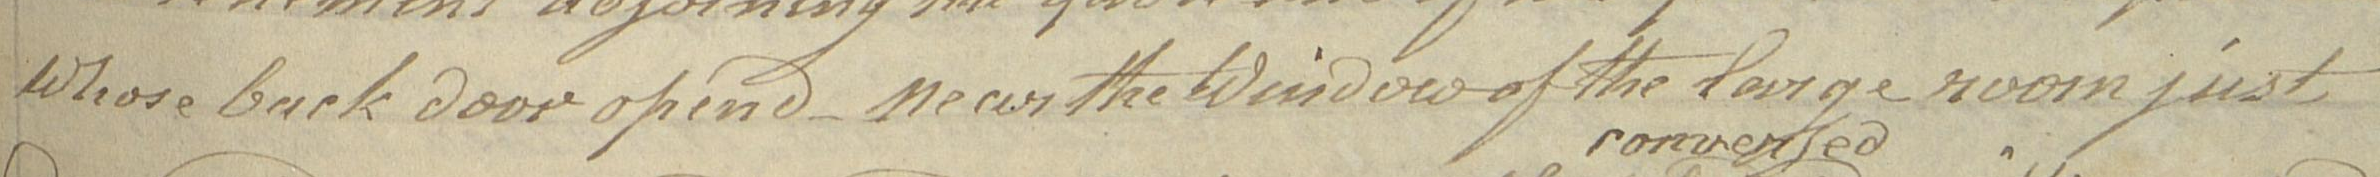Whose back door opend near the Window of the large room just
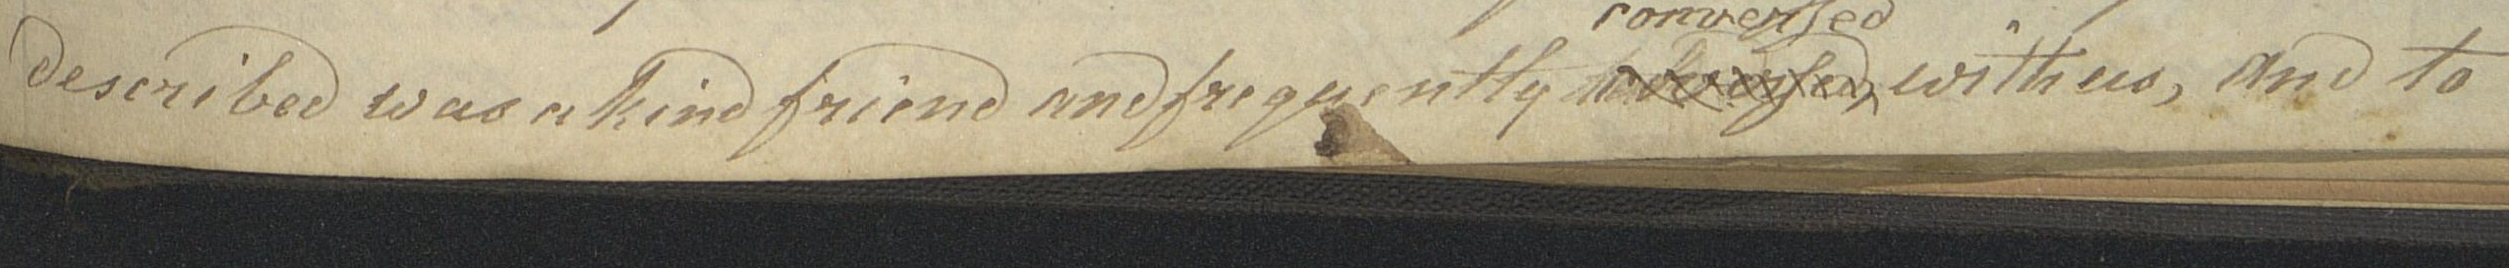described was a kind friend and frequently ^ coversed with us, and to
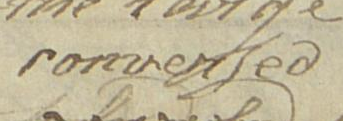conversed
